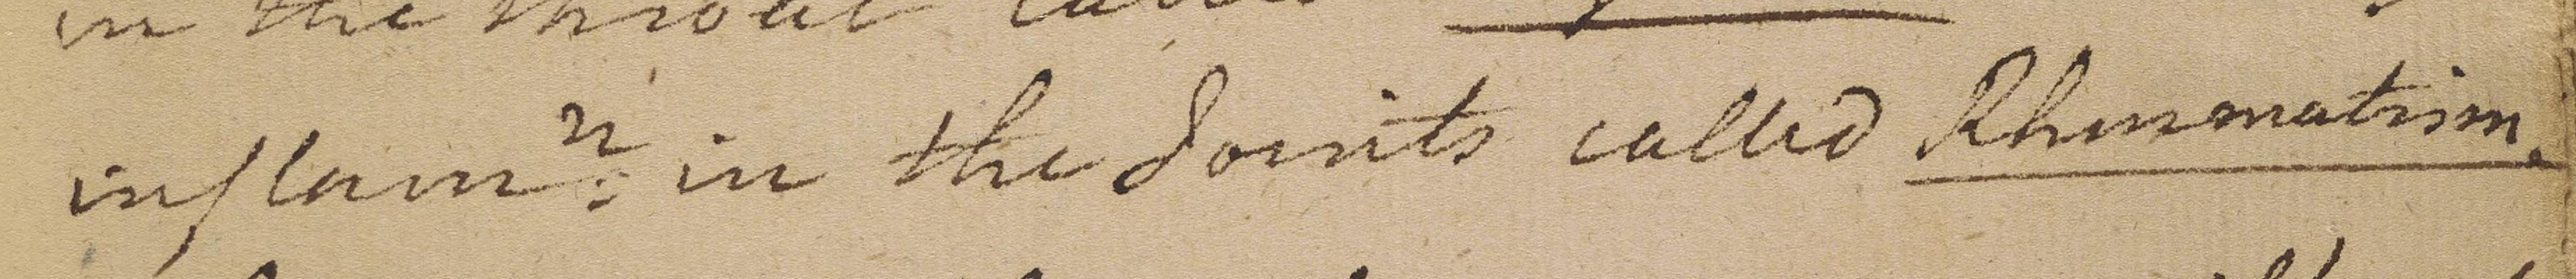inflam^n: in the Joints called Rheumatism
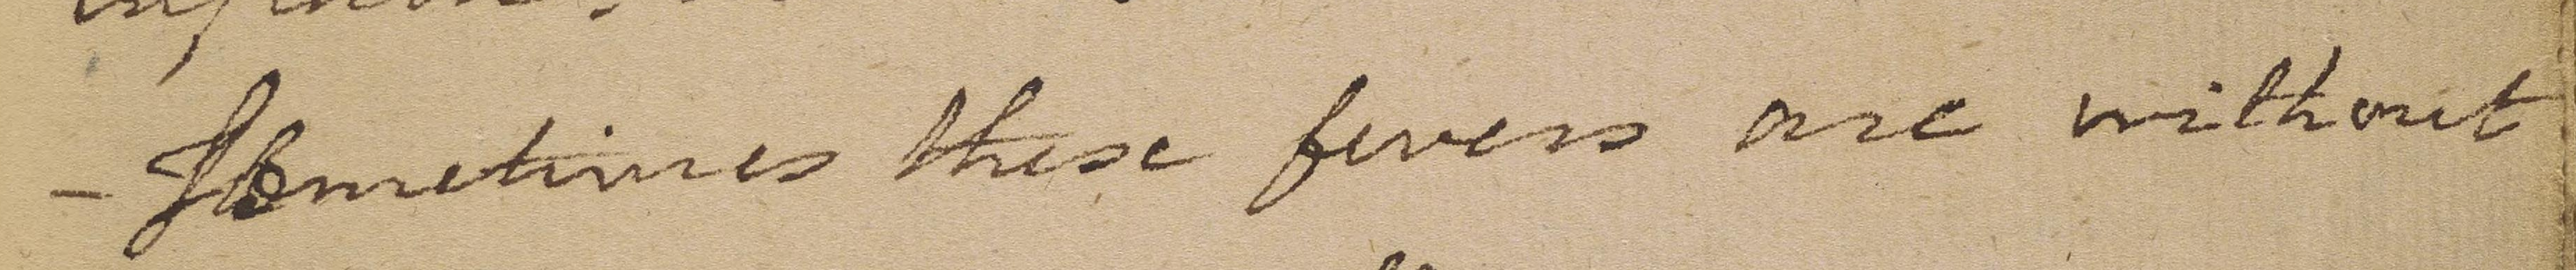- Sometimes these fevers are without
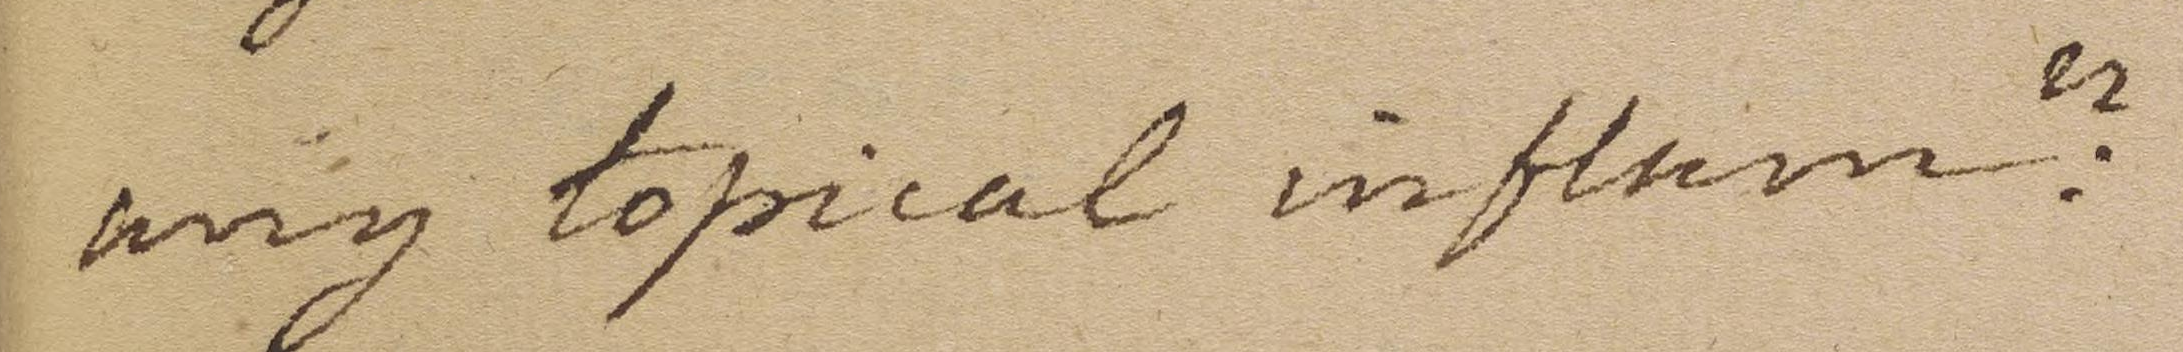any topical inflam^n:
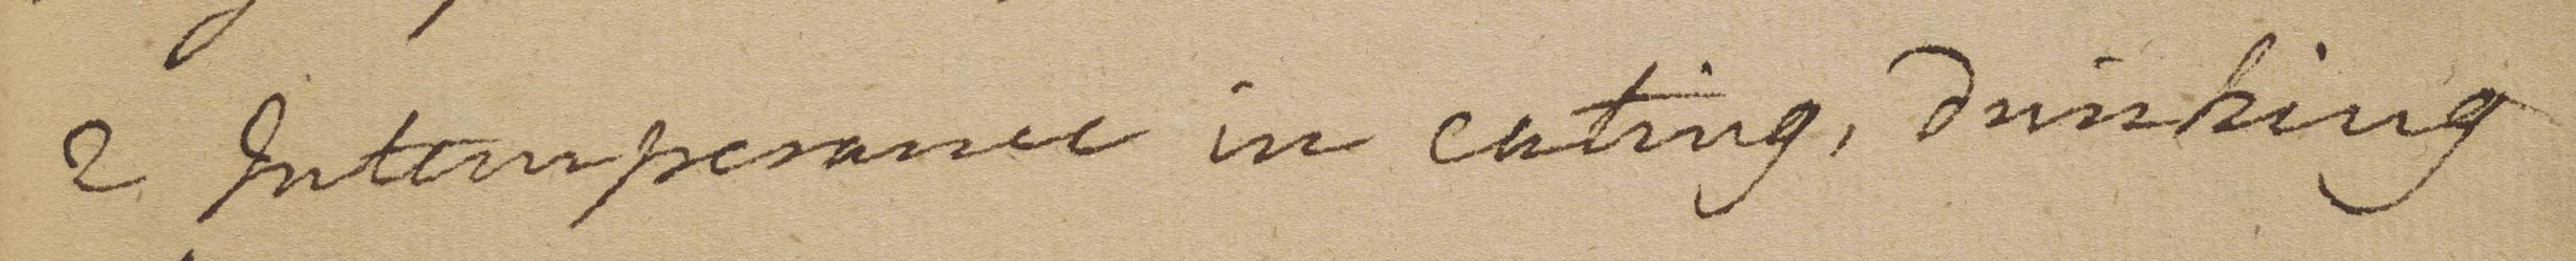2 Intemperance in eating, drinking
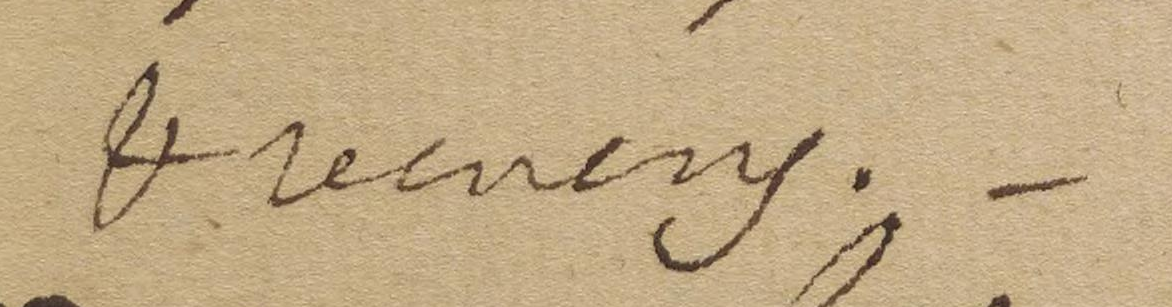& venery.-
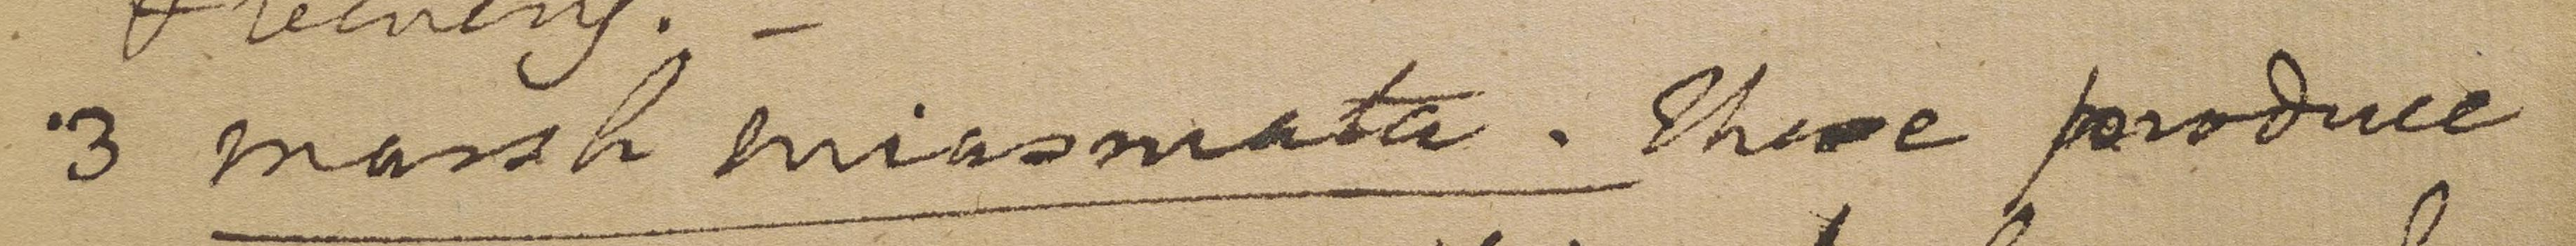3 Marsh miasmata. Those produce
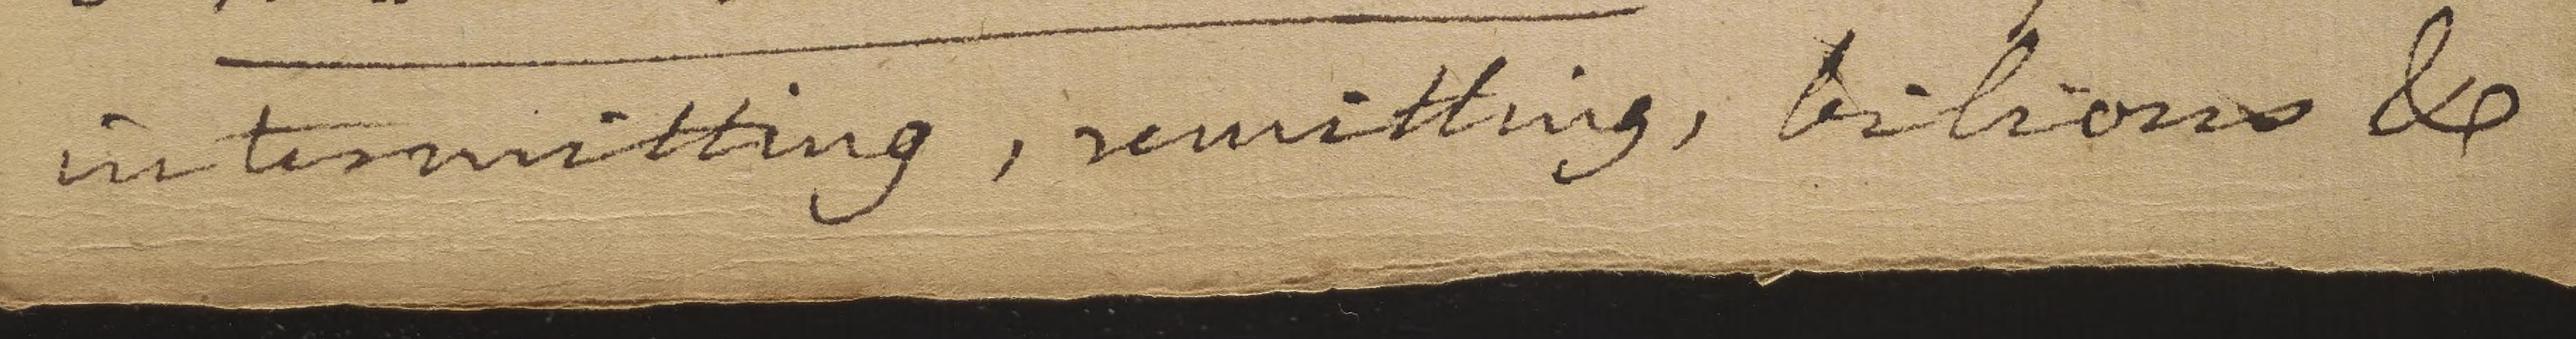intermitting, remitting, bilious &
